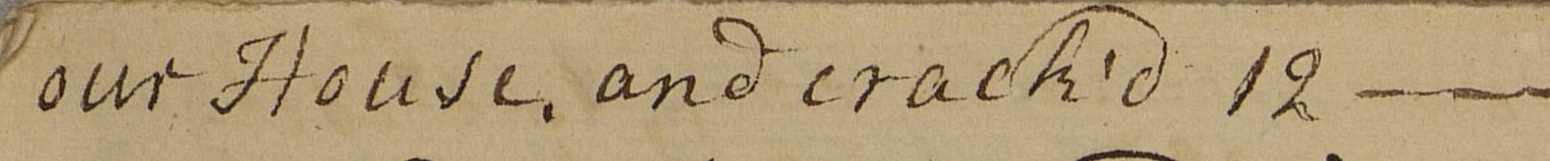our House, and crack'd 12-
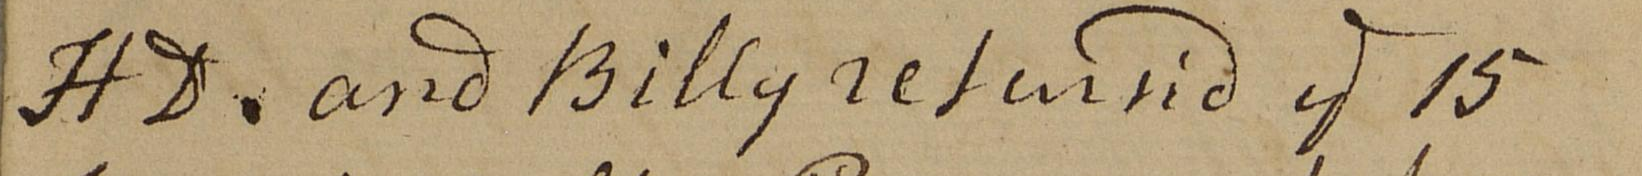HD. and Billy return'd y^e 15
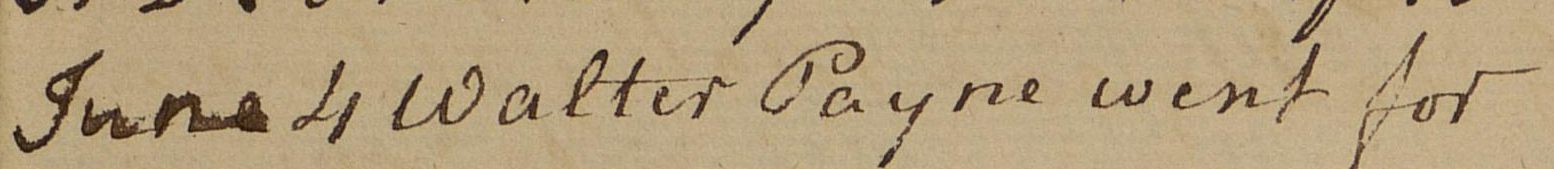June 4 Walter Payne went for
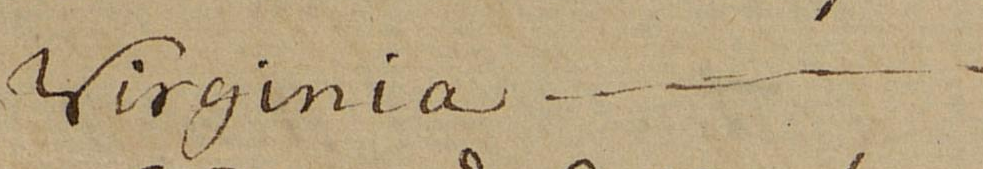Virginia---
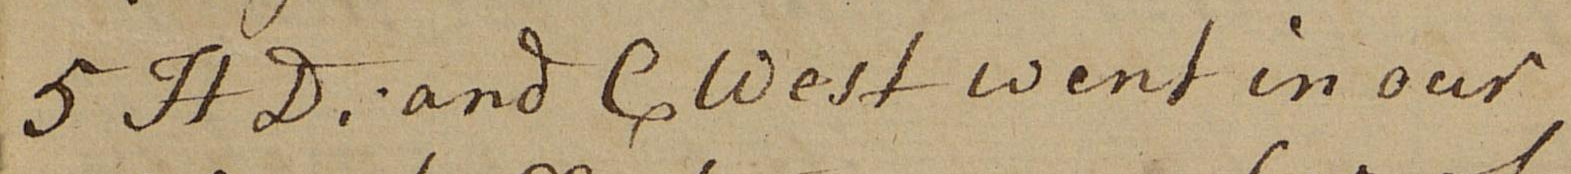5 HD. and C West went in out
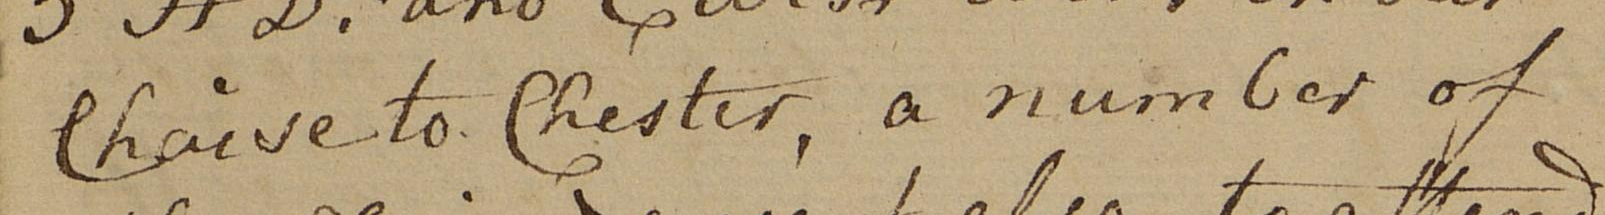Chaise to Chester, a number of
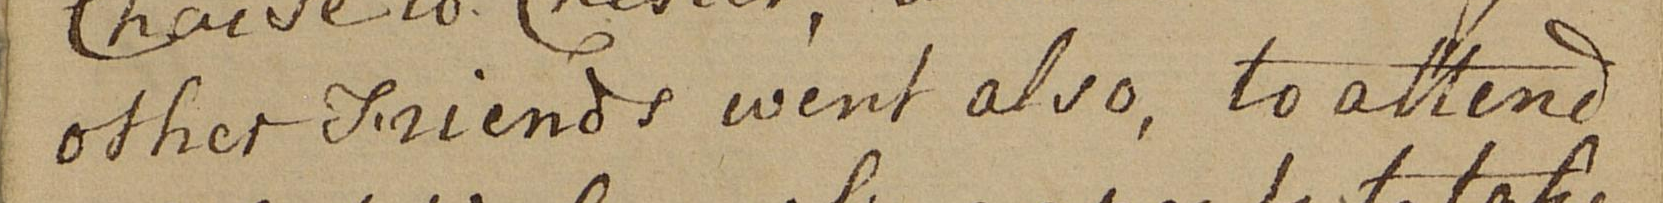other Friends went also, to attend
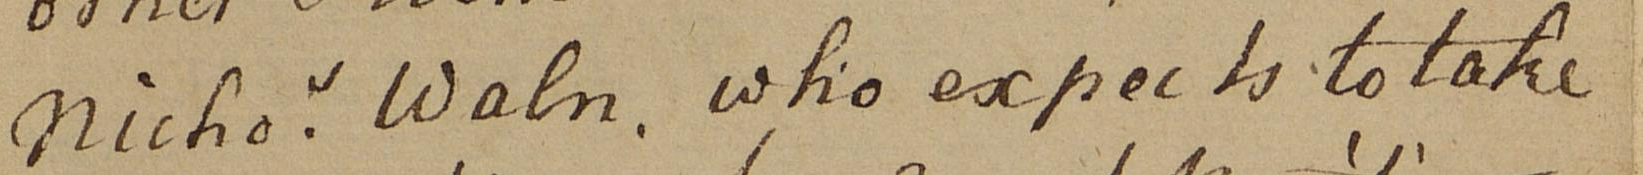Nicho.^s Waln, who expects to take
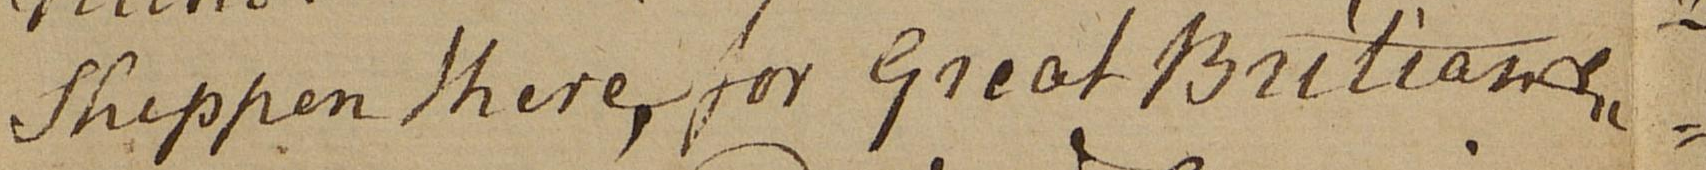Shippen there, for Great Britian [&c]
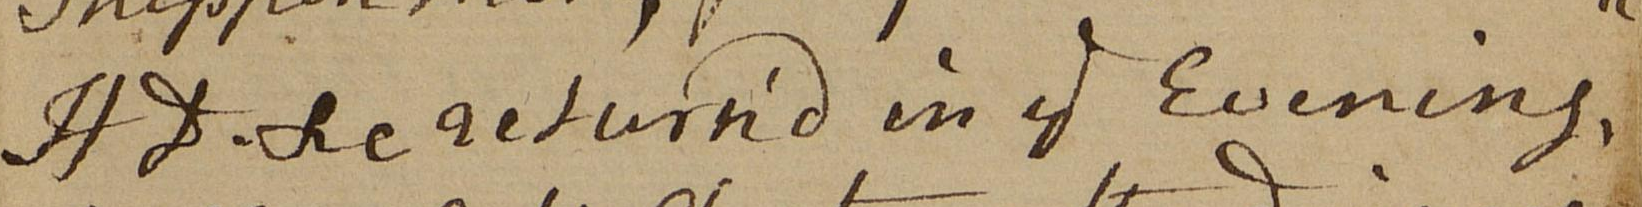HD &c return'd in y^e Evening,
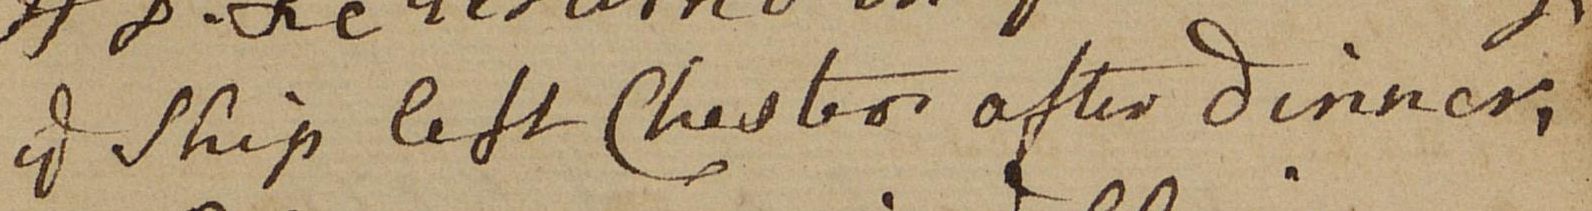y^e ship left Chester after dinner,
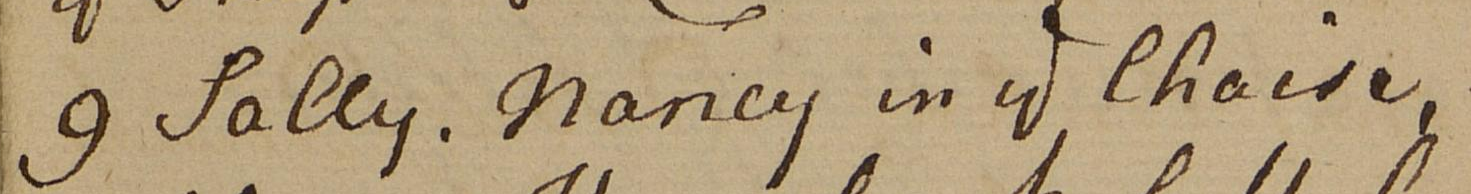9 Sally. Nancy in y^e Chaise
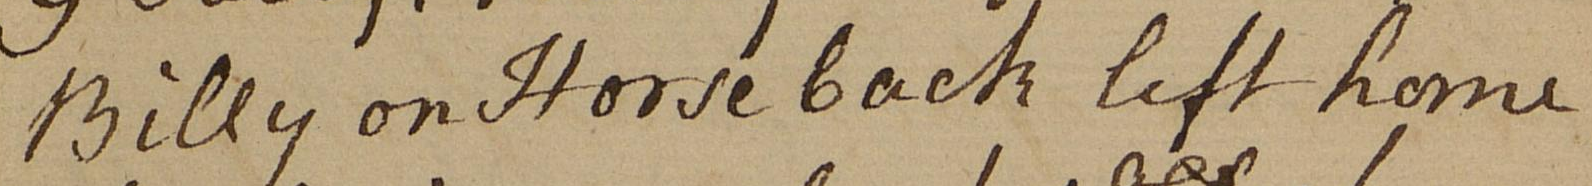Billy on Horse back left home
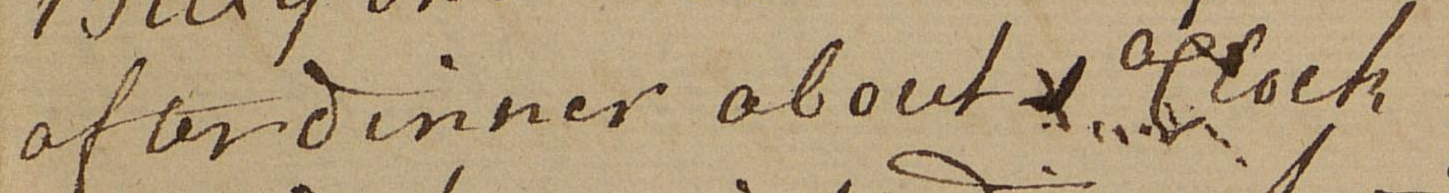after dinner about [_] ^o Clock
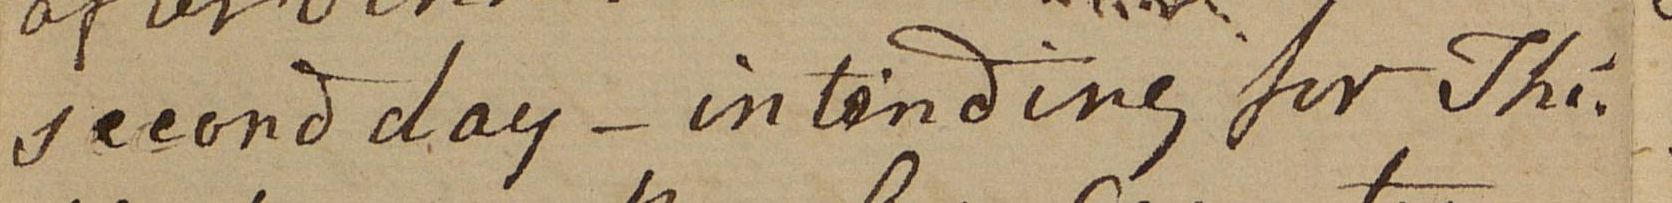second day- intending, for Tho.^s
